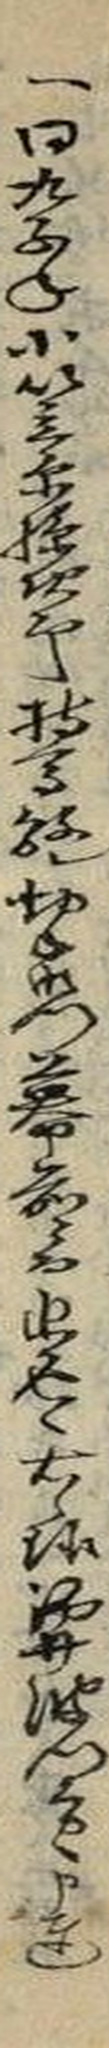一同九子年小笠原孫次郎持馬放レ切手御門幕前ニ而追返候右之趣酒井波門方へ申達
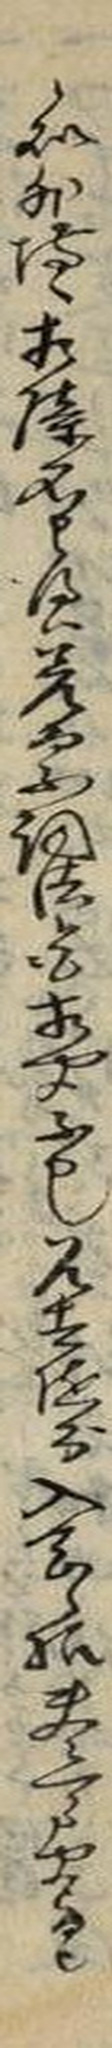候処外場へ相障不申候得はハ差而不調法とも相聞不申候乍去随分入念候様夫々可申聞旨被
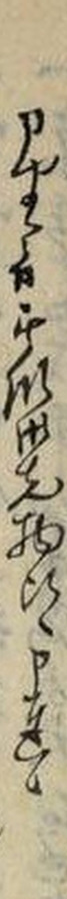申聞候ニ付其段御先物頭へ申達候
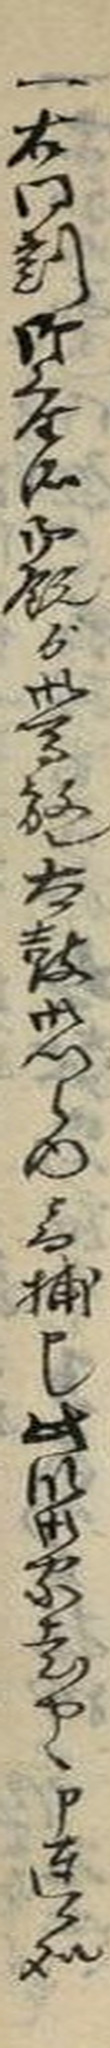一右同刻御座所御厩ゟ御馬放レ太鼓御門之内ニ而捕申候此段御家老中へ申達候処
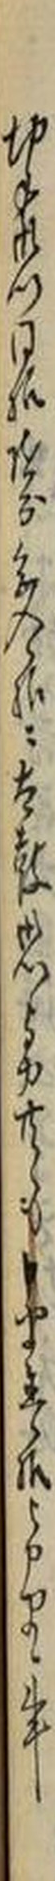切手御門同様随分念入候様ニ太鼓御門与力共へも申聞置候様被申聞候事
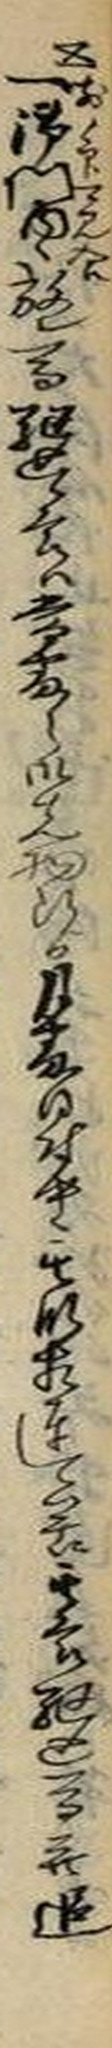一御門内へ放レ馬駆込候節ハ当番之御先物頭ゟ月番目付中へ其段相達候筈其節駆込馬并追
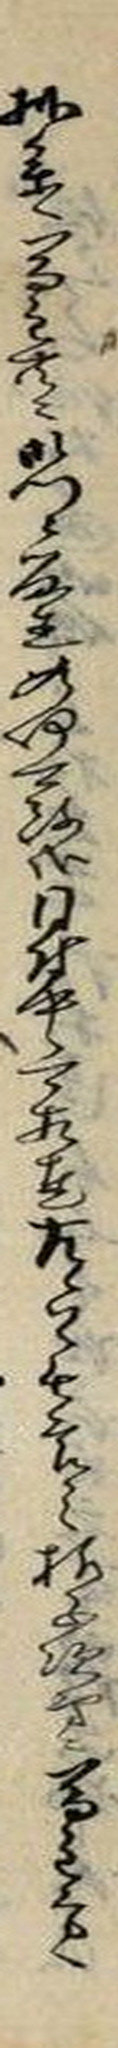掛参候馬主共ニ御門ニ留置如何可致哉目付中へ可相達左候ハヽ其節之様子次第ニ馬主方へ
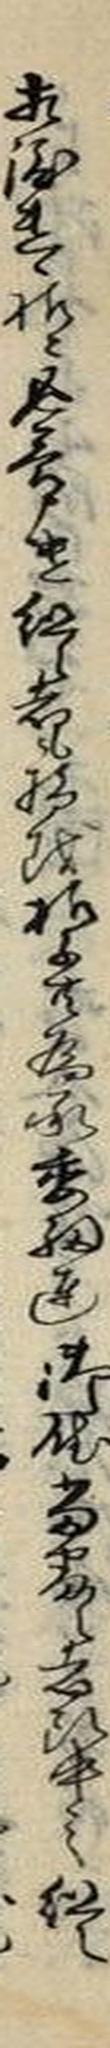相渡遣候様ニ返答申遣組之者も指越様子共為承委細達御聴当番之者頭中之組之
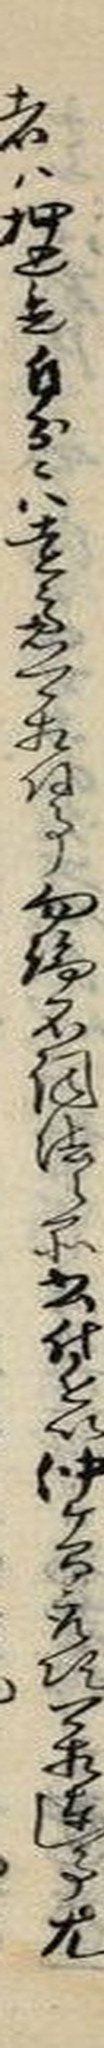者ハ押込置自分ニハ遠慮可相伺事勿論不調法之品書付を以仲ケ間取次可相達事尤
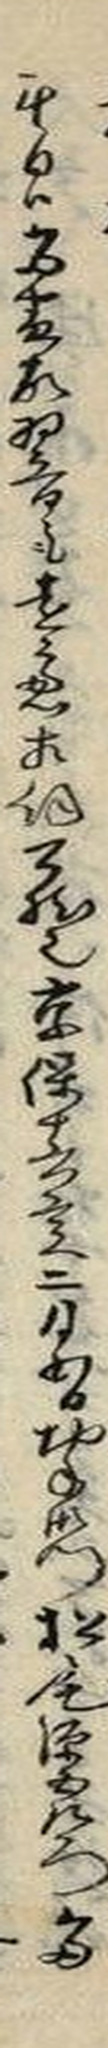其日ハ当番故翌日ニも遠慮相伺可然也享保十六亥二月五日切手御門松尾源五左衛門当
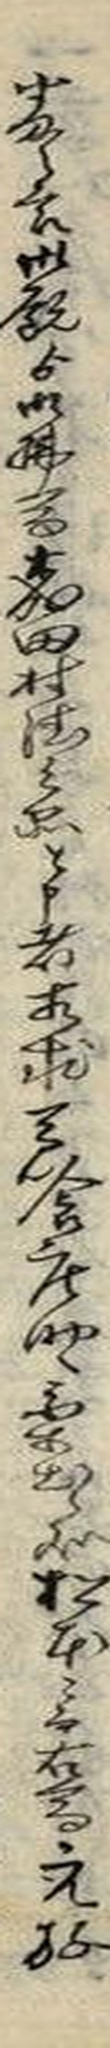番之節御厩ゟ御払馬森田村徳兵衛と申者相求馬喰庄助へ牽出候処松本ニ而右馬取放
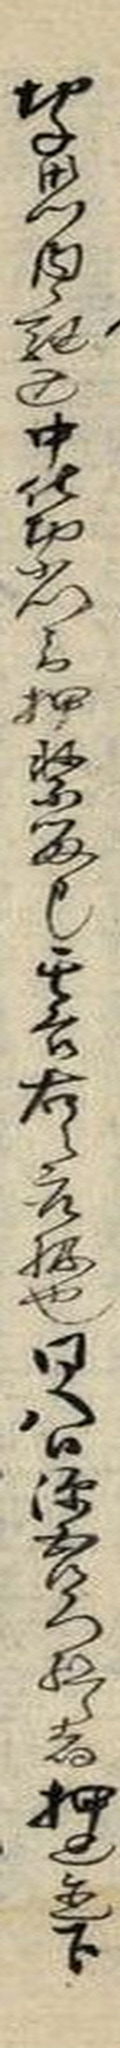切手御門内へ駆込中仕切御門ニ而押繋留申候其節右之取扱也同八日源五左衛門組之者押込置下
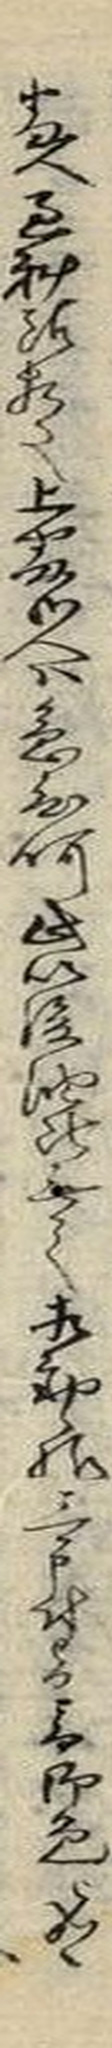番人過料銀拾匁上番人弐人ハ急度呵此以後油断無之相勤候様ニ可申付旨ニ而御免被成候
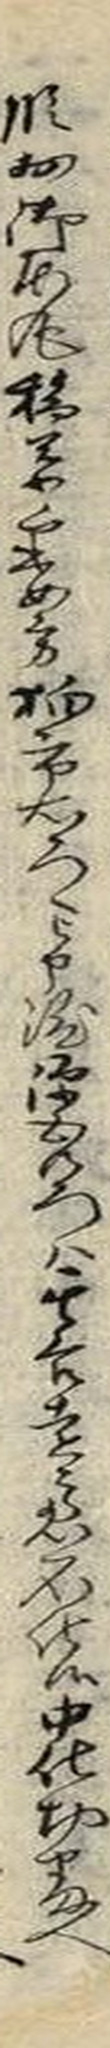段於御本丸稲葉采女方狛市右衛門へ被申渡源五左衛門ハ其節遠慮不仕候中仕切番人
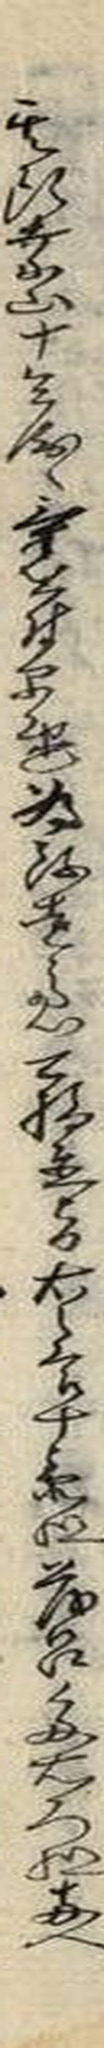其頭桑山十兵衛へ気を付早速為致遠慮可指置旨右之節十兵衛組茂呂多右衛門組両人
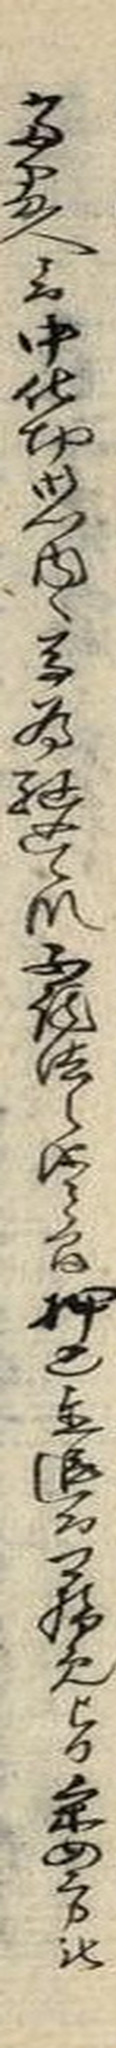当番人ニ而中仕切御門内へ馬為駆込候段不調法之儀ニ候間押込置追而可指免旨采女方被
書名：御門御櫓之部
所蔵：福井県文書館 Fukui Prefectural Archives
